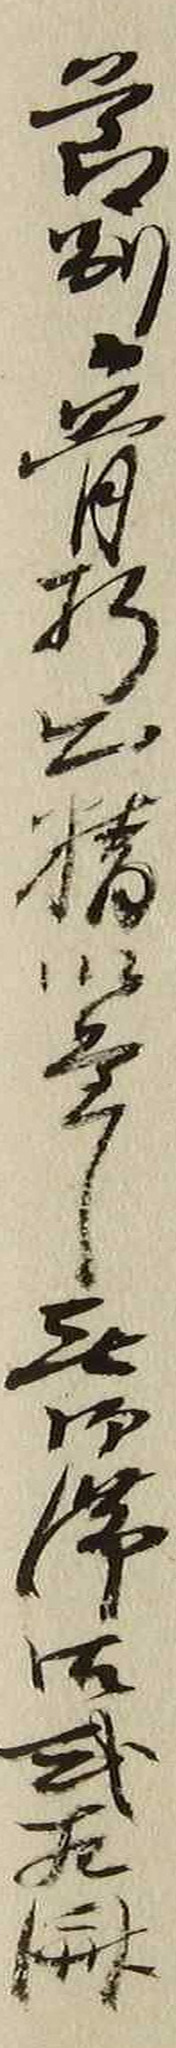節別而骨折出精いたし無御滞御式相済
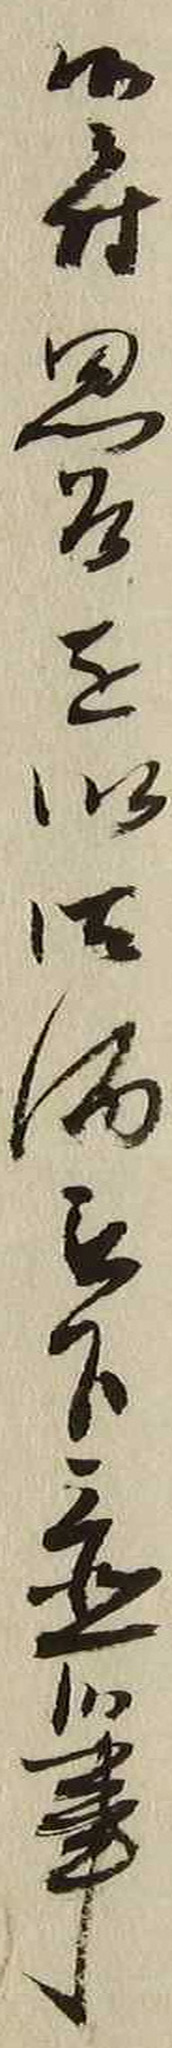候ニ付思召を以御酒被下置候事
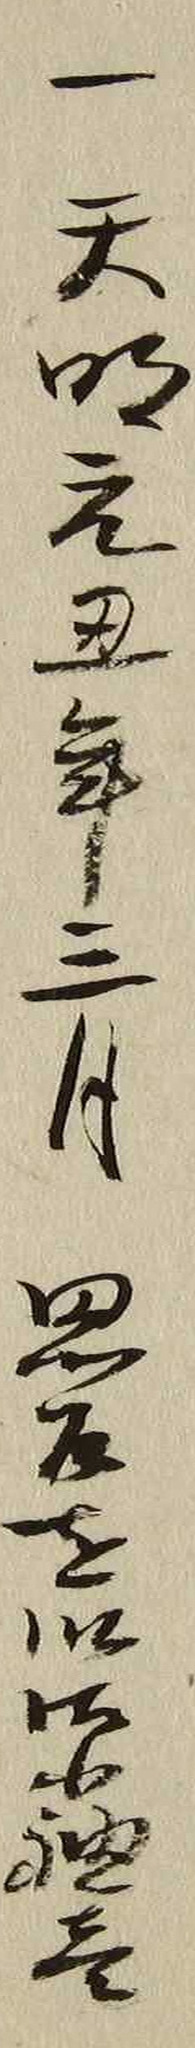一天明元丑年三月思召を以御小袖壱
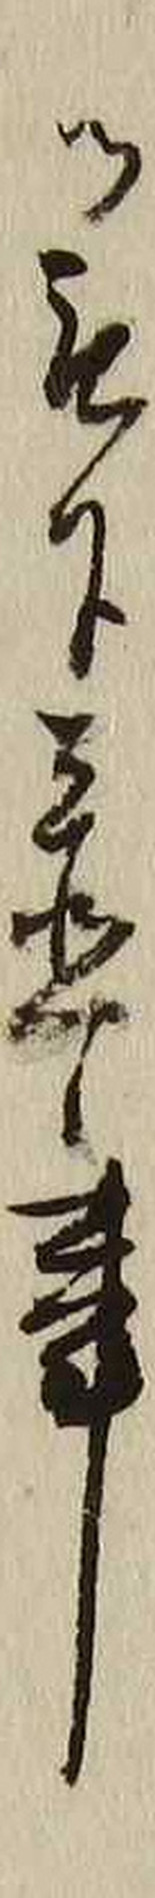被下置候事
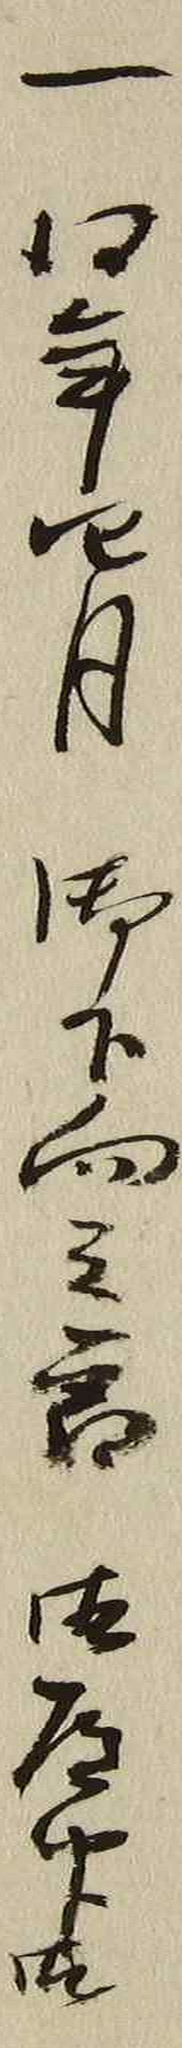一同年四月御下向之節御道中御
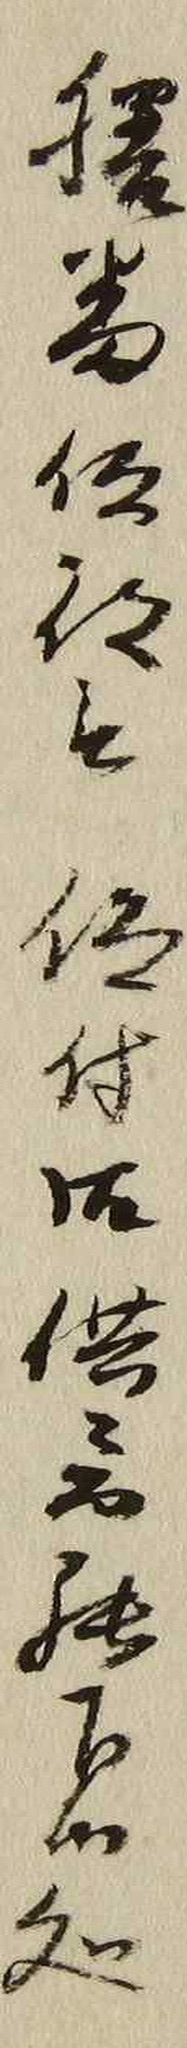膳番仮役被仰付御供ニ而罷下候処
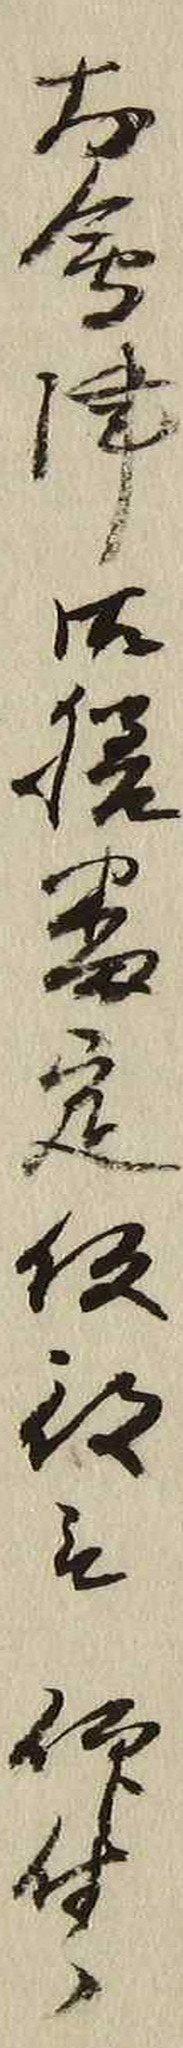於会津御膳番定仮役被仰付候
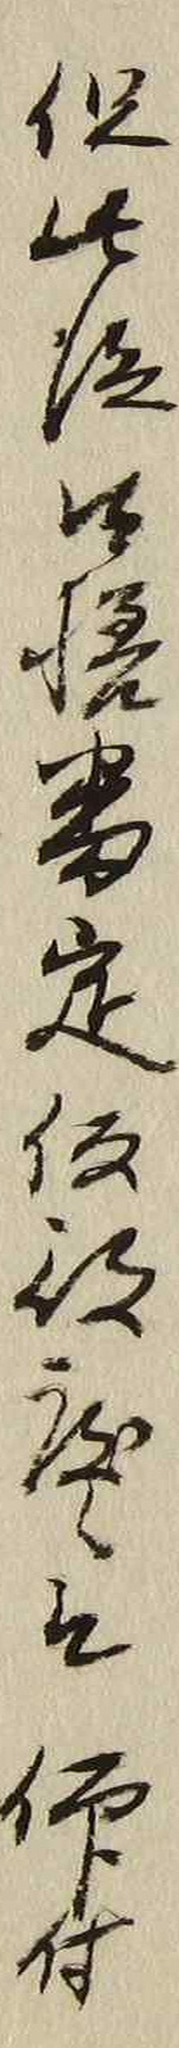但此後御膳番定仮役度々被仰付
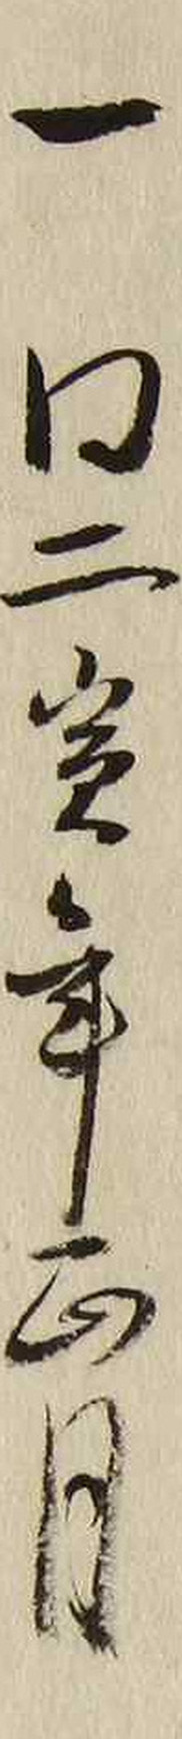一同二寅年正月
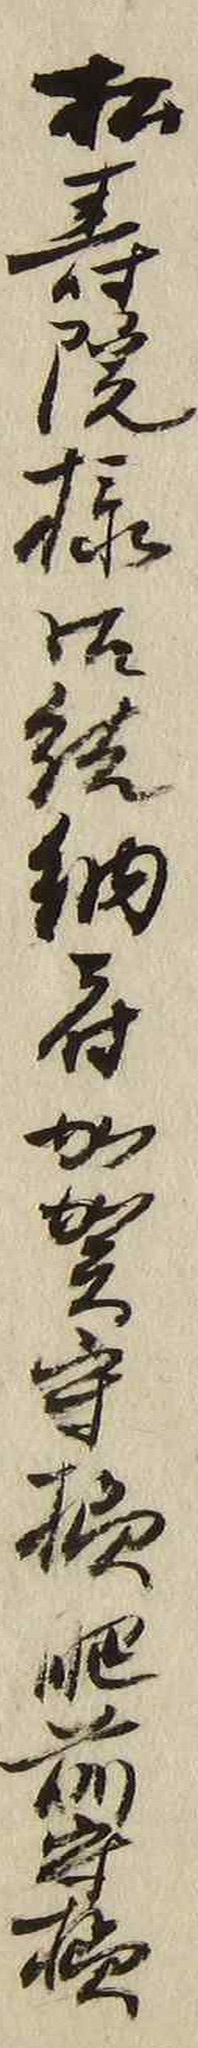松寿院様御結納ニ付加賀守様肥前守様

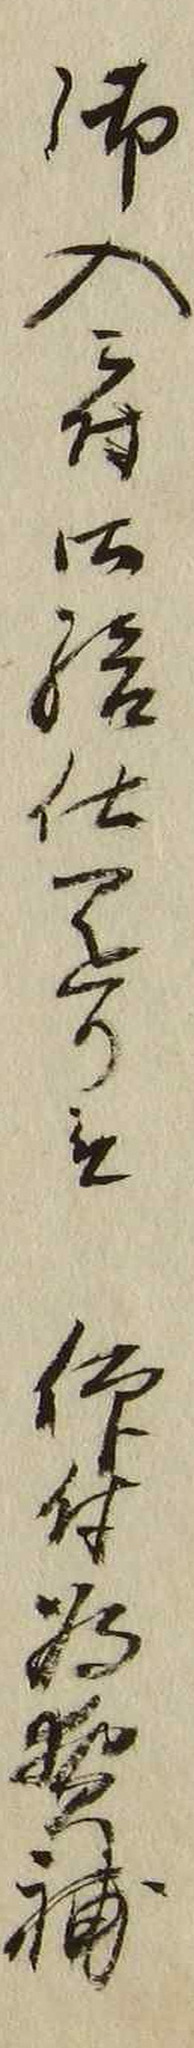御入ニ付御給仕懸り被仰付為費補
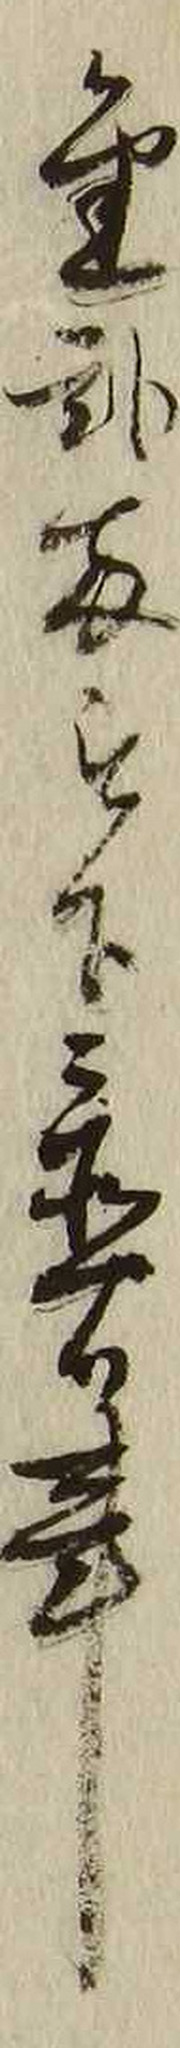金弐両被下置候事
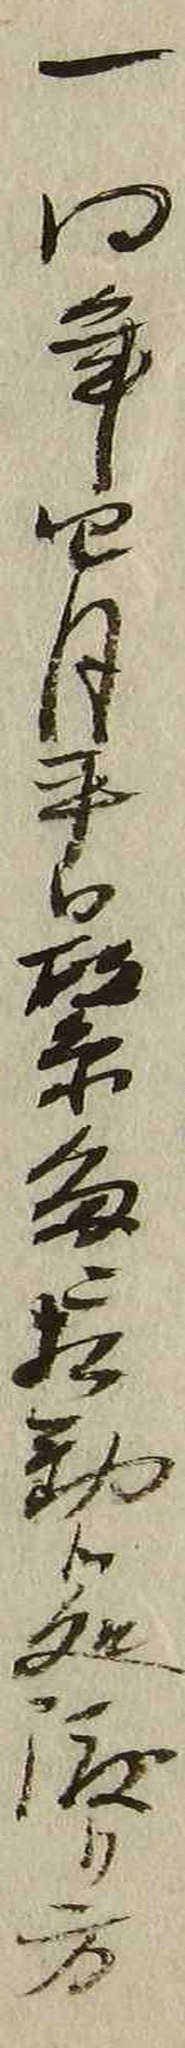一同年四月平日繁多ニ相勤候処渡り方
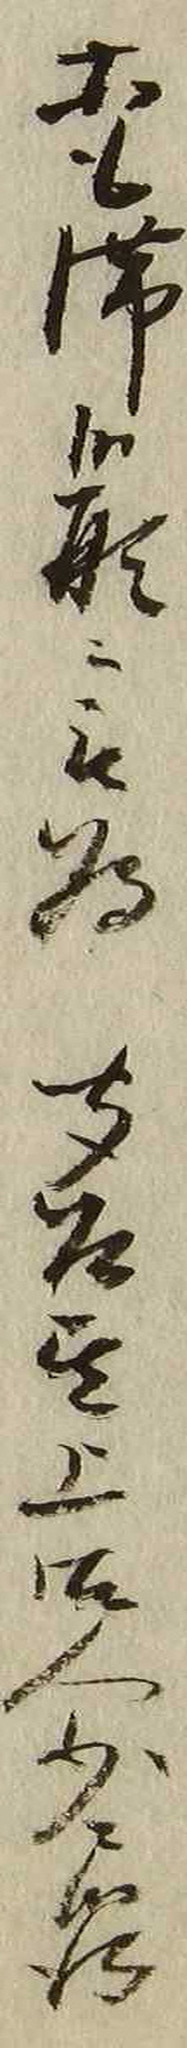等も滞候形ニ被為聞召其上御人少ニ候得
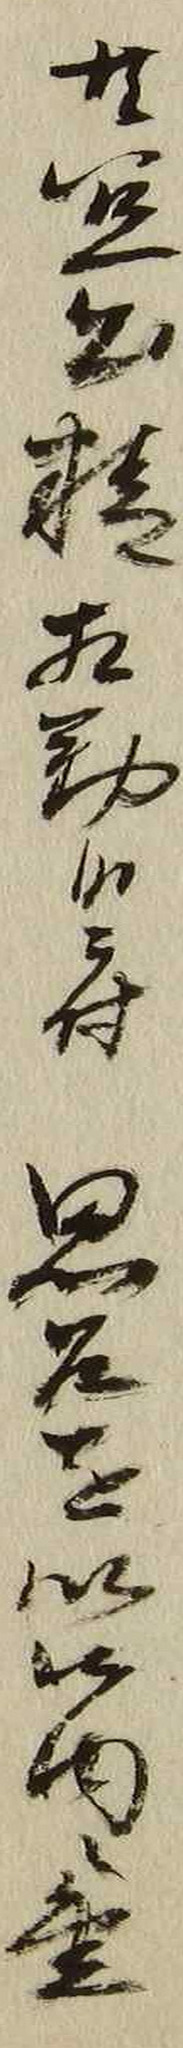共宜出精相勤候ニ付思召を以御内々金
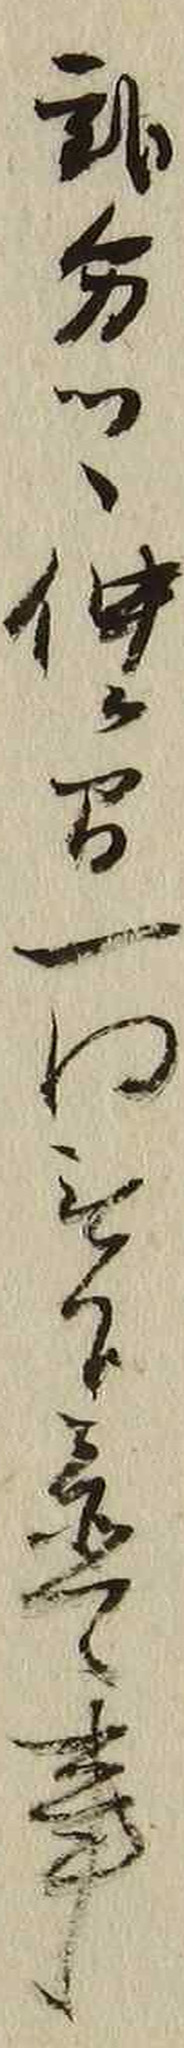弐分ツヽ仲ケ間一同被下置候事
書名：諸士系譜　巻之345　も之部1
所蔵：会津若松市立会津図書館
